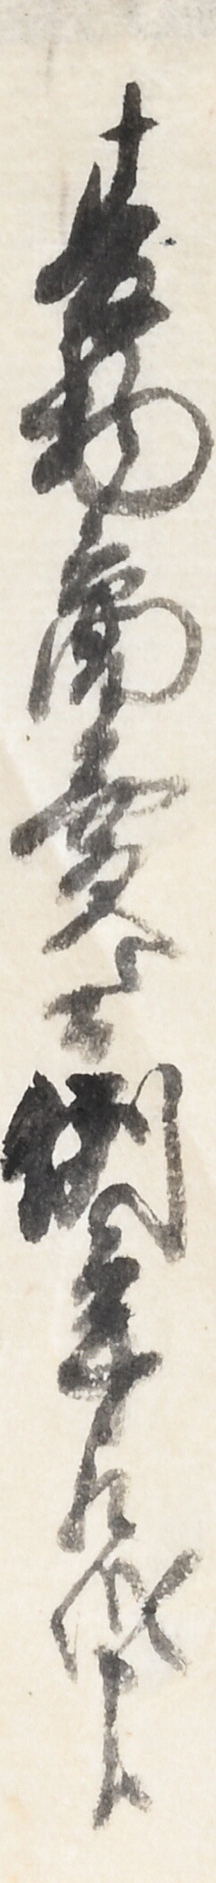夏物商売ニ而例年罷越申候
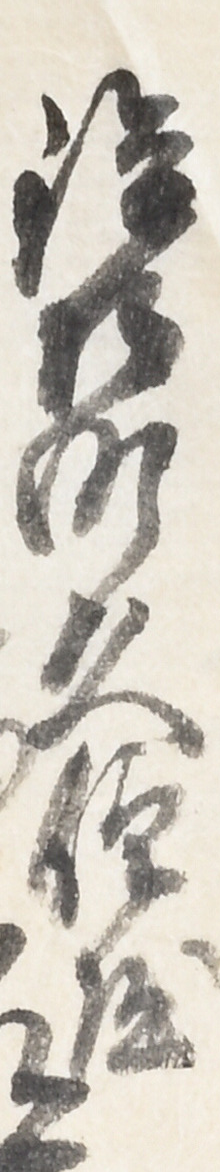鉾持町久住屋
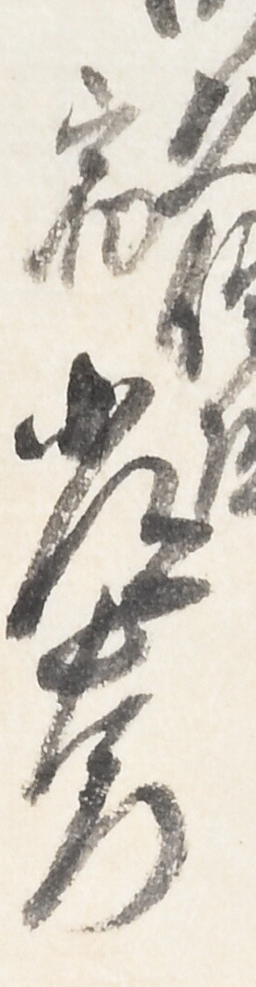宿常右衛門
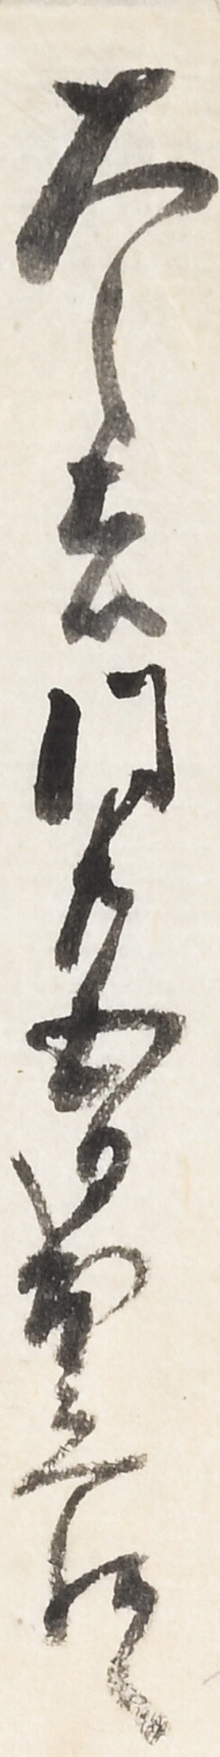右之者同廿五日出立仕候
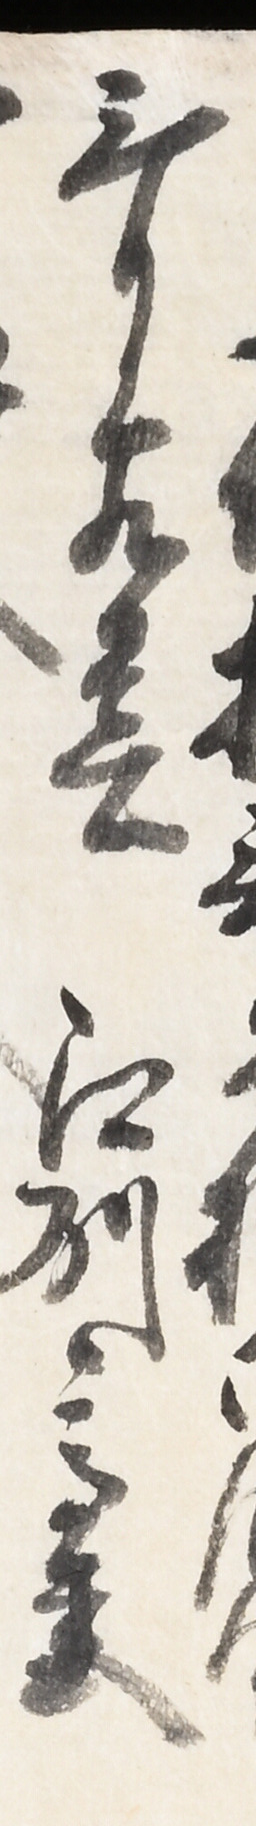三月十九日着江州高宮
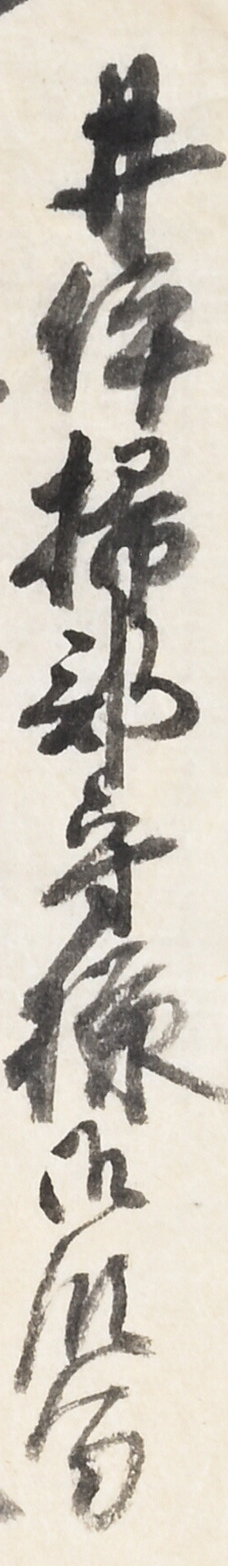井伊掃部守様御領分
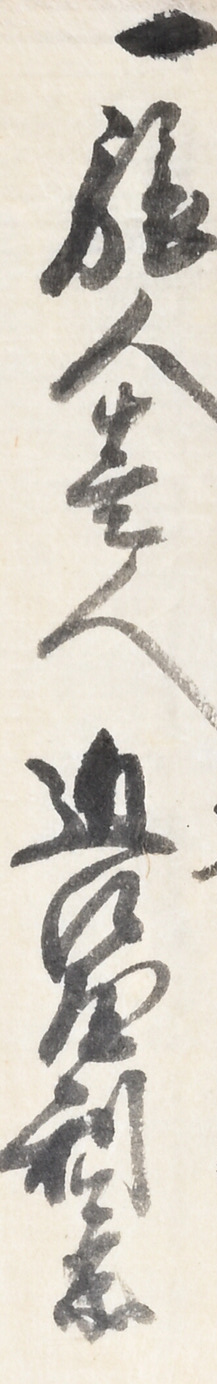一旅人壱人近江屋利兵衛
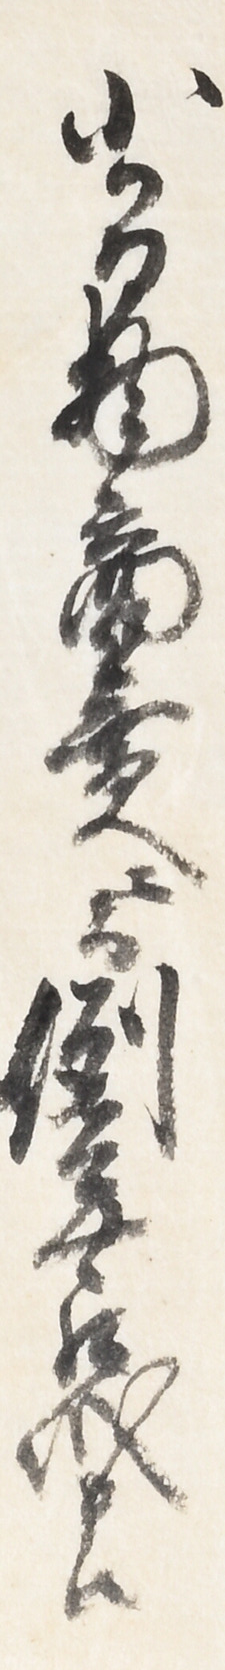小間物商売ニ而例年罷越申候
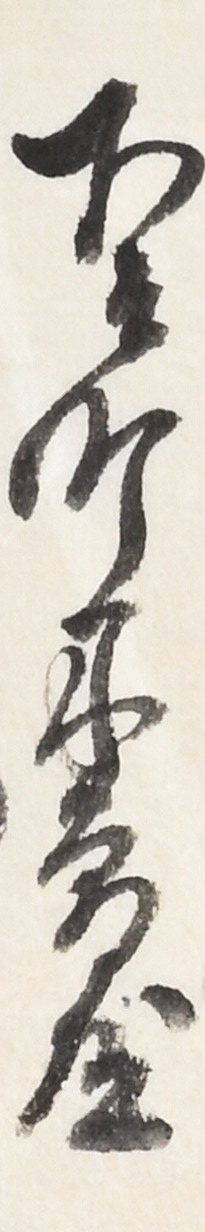下モ町木曽屋
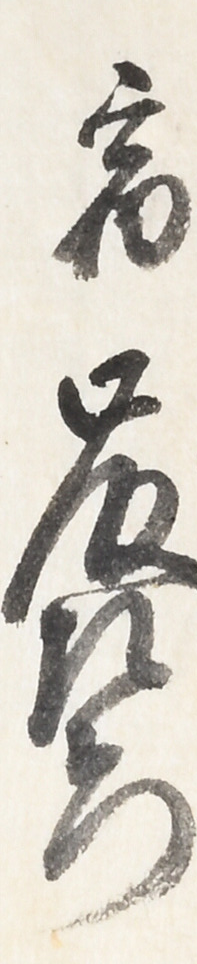宿籐左衛門
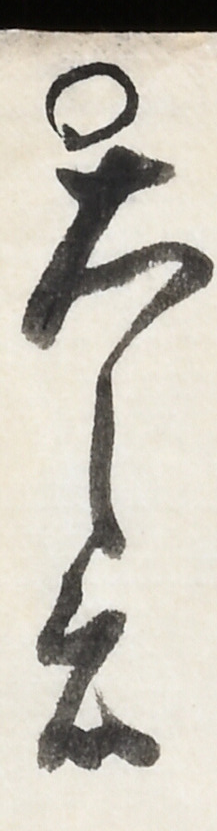〇右之者
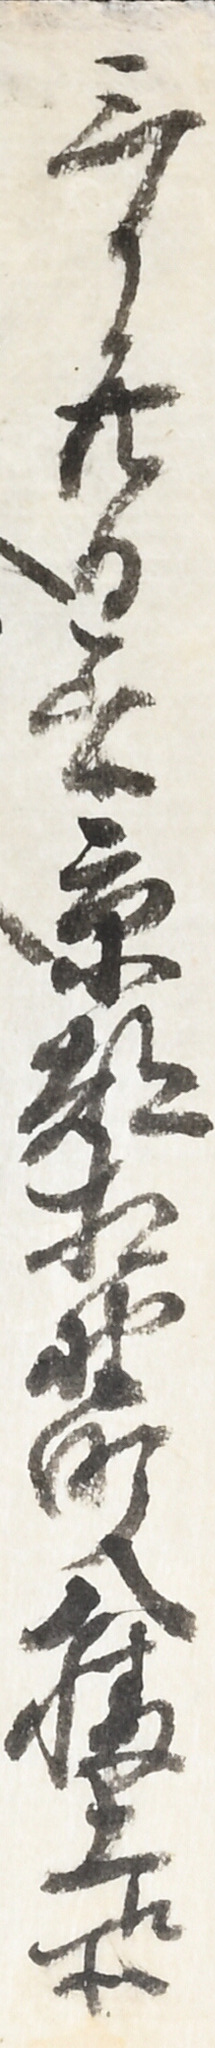三月廿日着京都相野町八幡上ル所
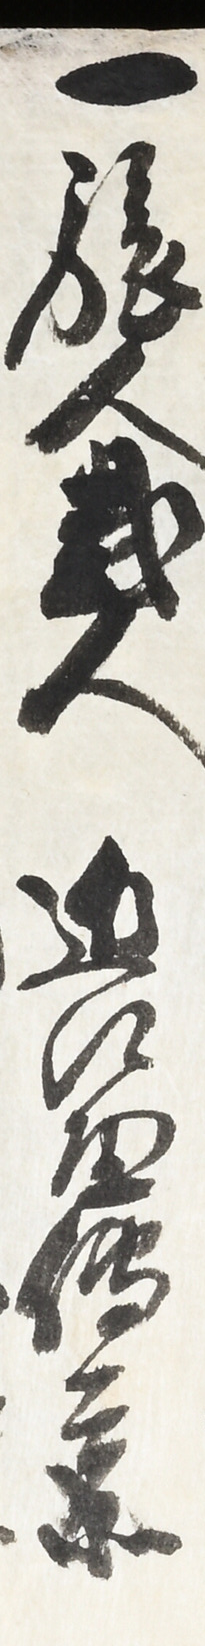一旅人弐人近江屋伝兵衛
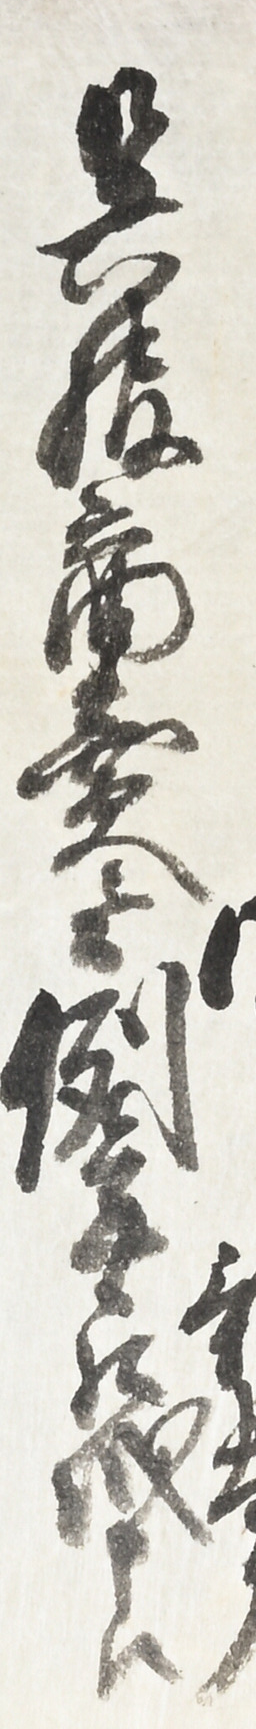呉服商売ニ而例年罷越申候
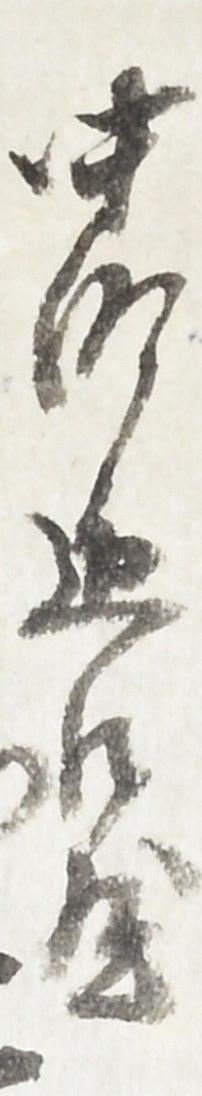中町近江屋
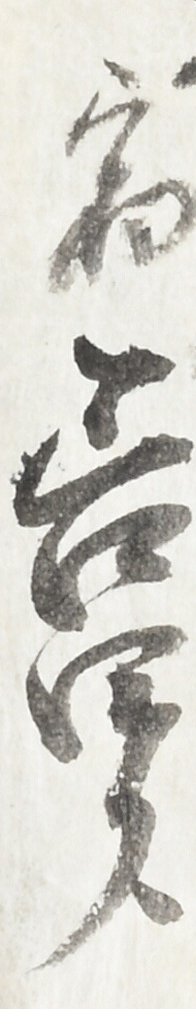宿善四郎
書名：旅人泊控帳
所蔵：伊那市立高遠町図書館・合同会社AMANE
